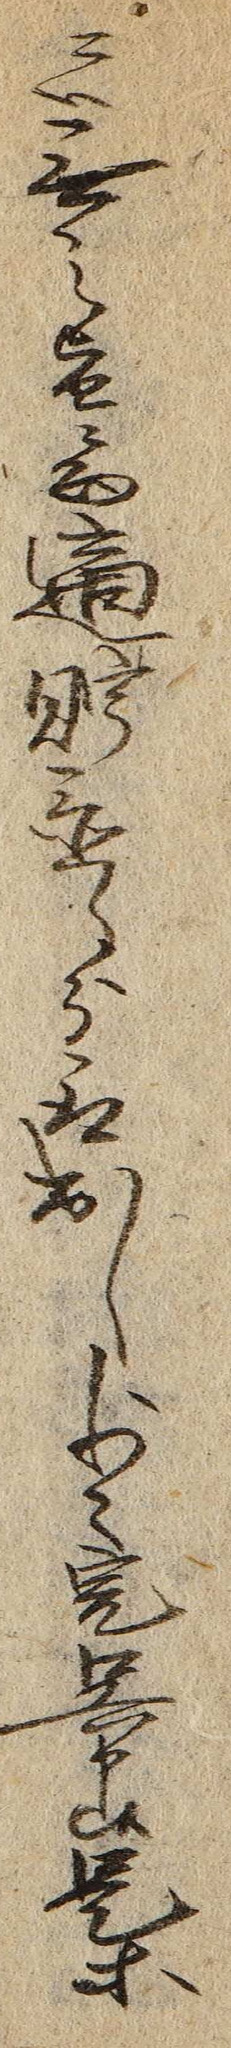には無之旨にて適貯置候分取出し少々完呉申候是等
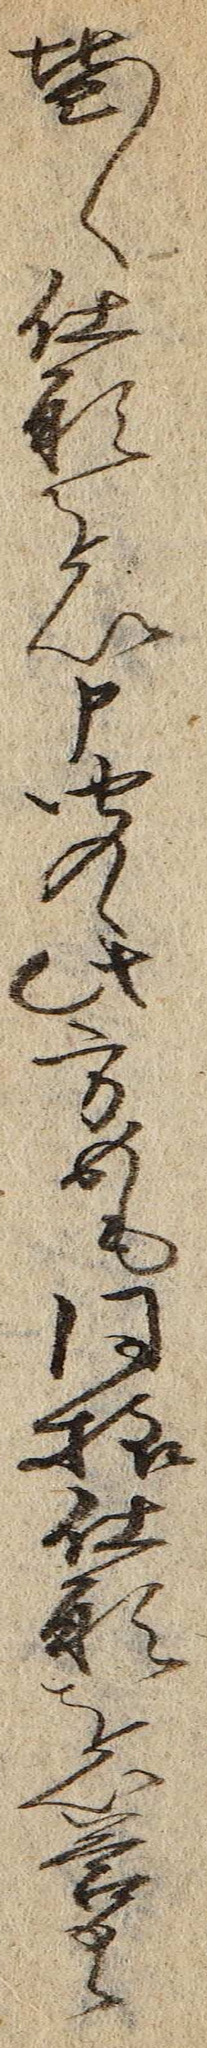皆〳〵仕形もを以て申聞候此方よりも同様仕形を以答申候
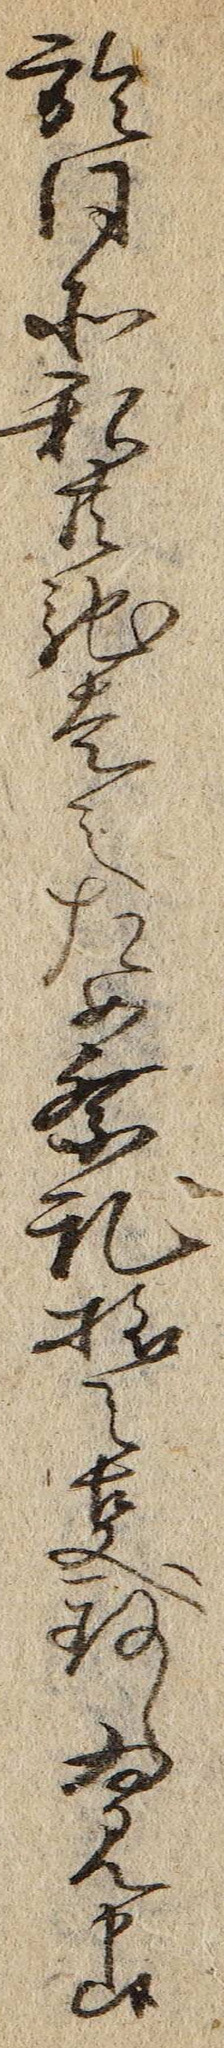於同所私ども馳走のため祭礼様の事致し為見申候
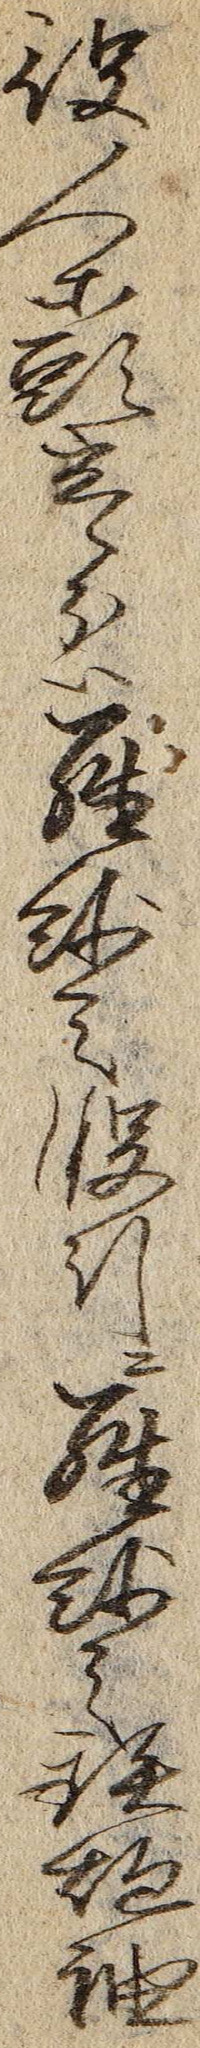役人等頭立候分は羅紗の股引に羅紗の鉄砲袖
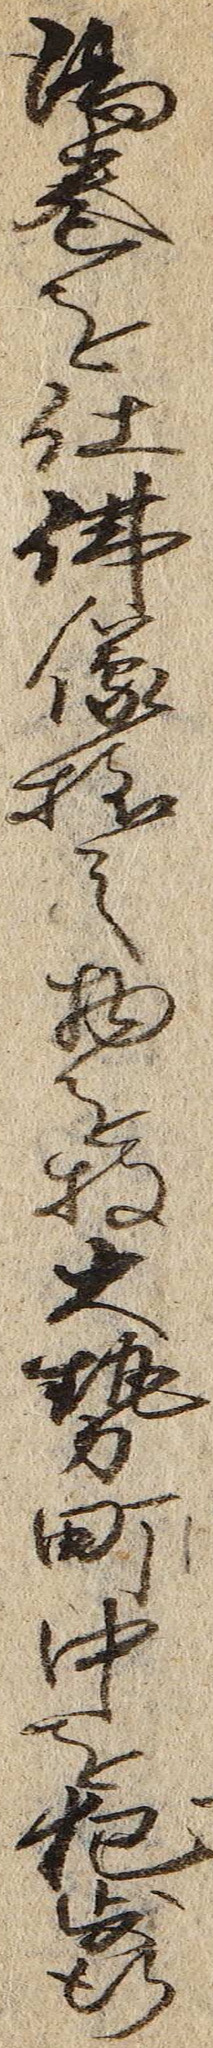湯巻を仕仏像様の物を持大勢町中を歩行
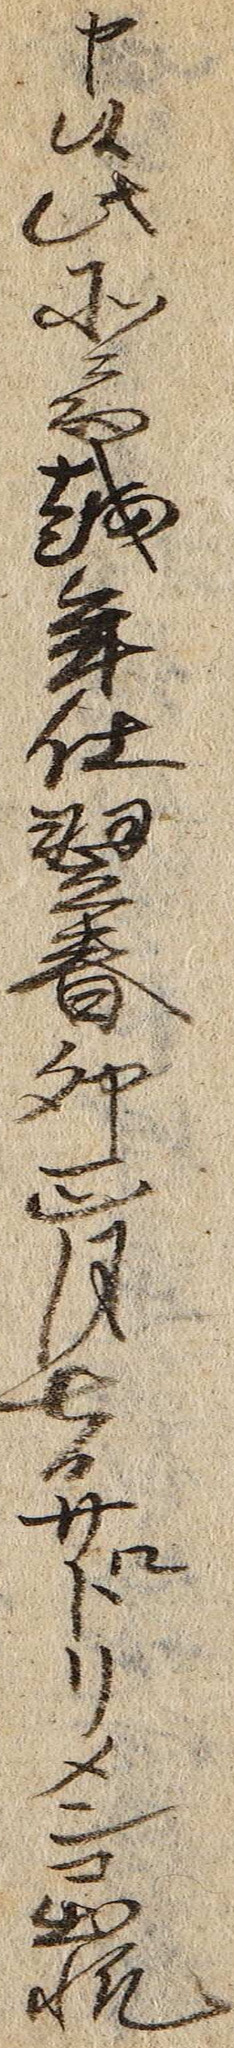申候此所にて越年仕翌春卯正月七日サルトリメンコ出帆
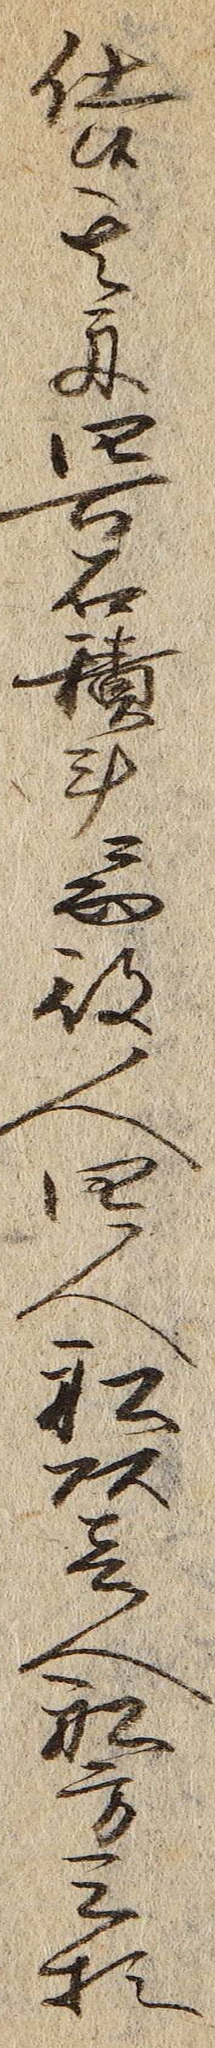仕候其舟四百石積斗にて役人四人船頭一人船方三十
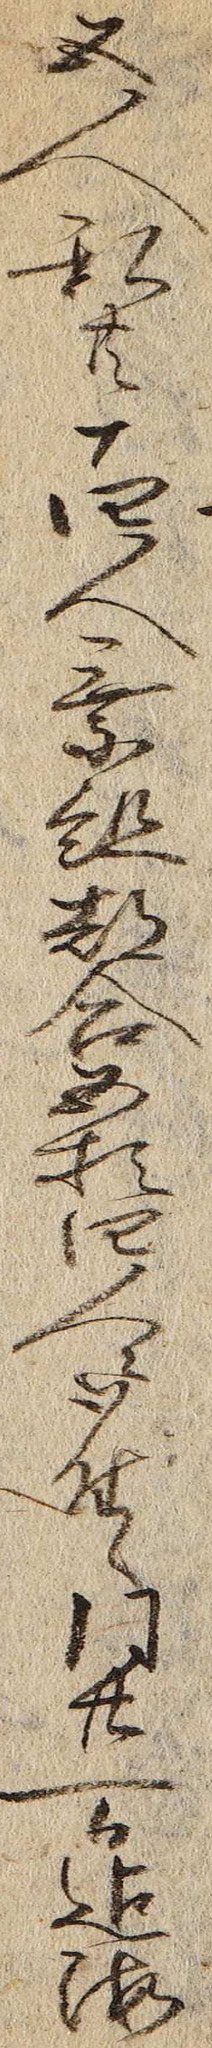五人私ども十四人乗組都合五十四人御座候同二十一日まで海
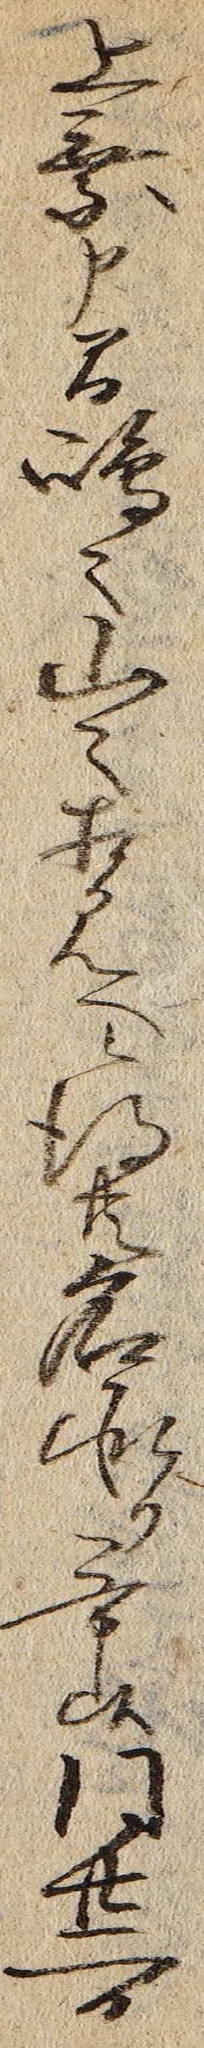上乗申間島の山々相見へ候得ども名承り不申候同二十二日
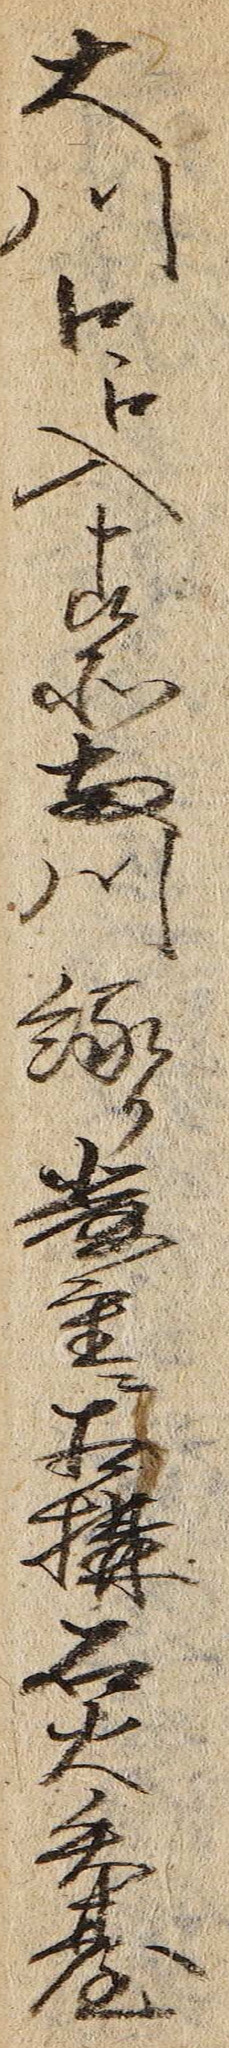大川口へ入申候所両川縁リ厳重に相構いし石火矢台
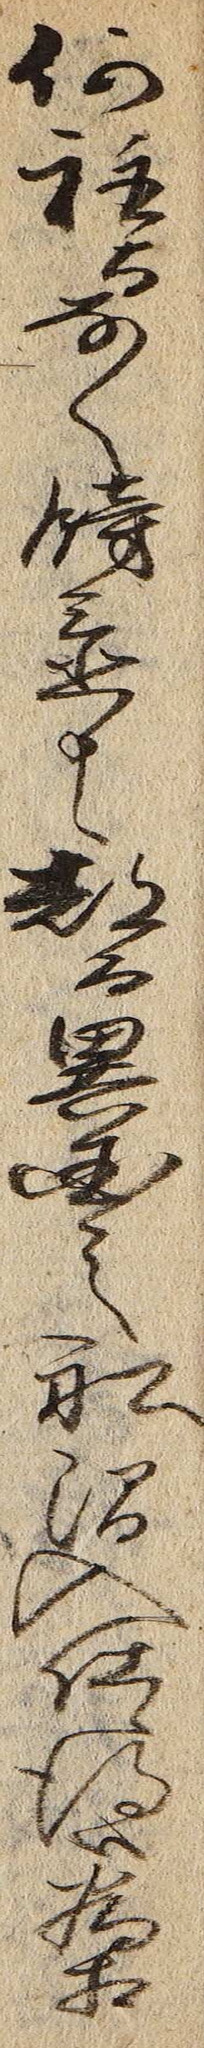何程となく傍置申候都て異国の澗入仕候得ば為相
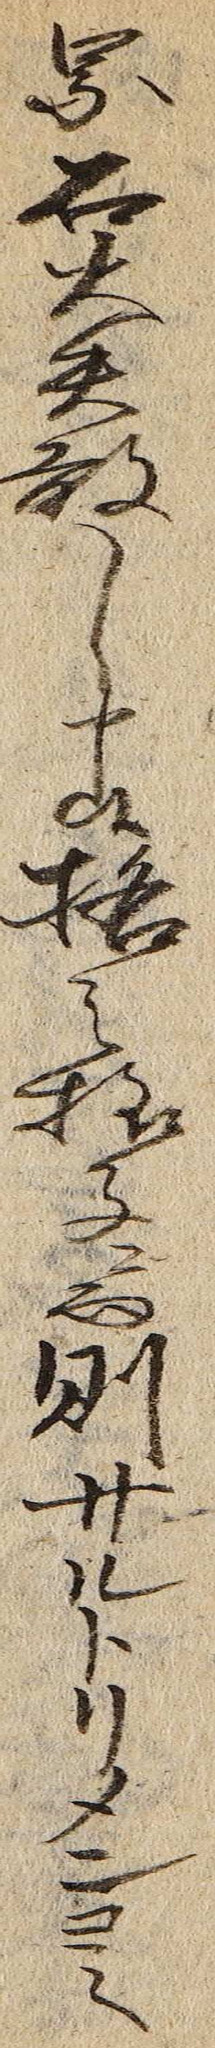図石火矢放し申候格の様子にて則サルトリメンコの
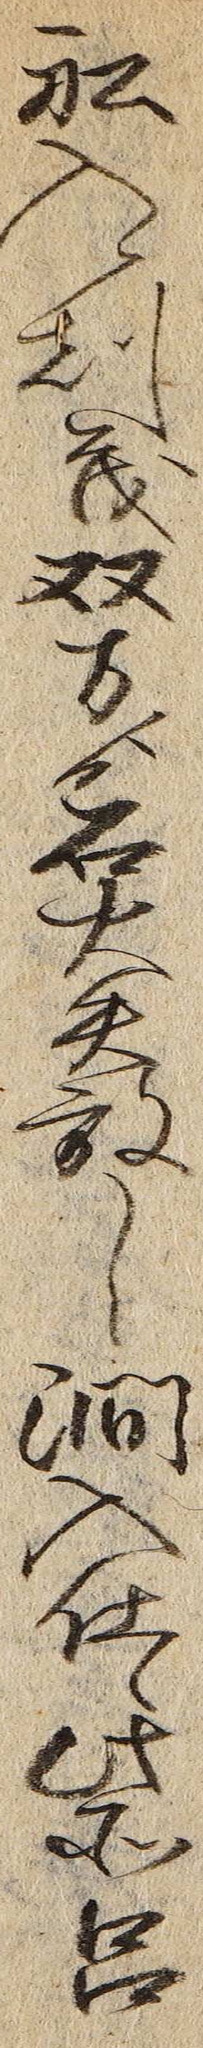船入候刻も双方より石火矢放し澗入仕候此所呂
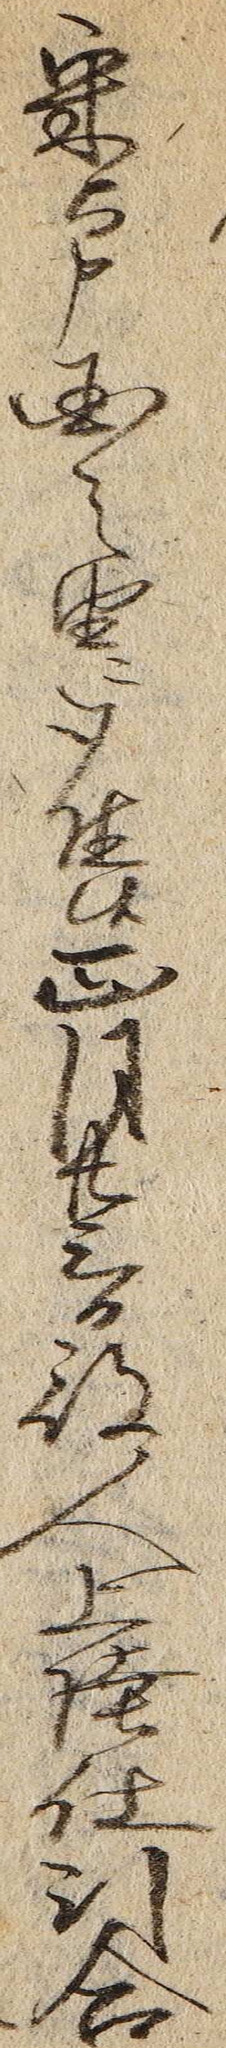宋と申国の由に御座候正月二十三日役人上陸仕引合
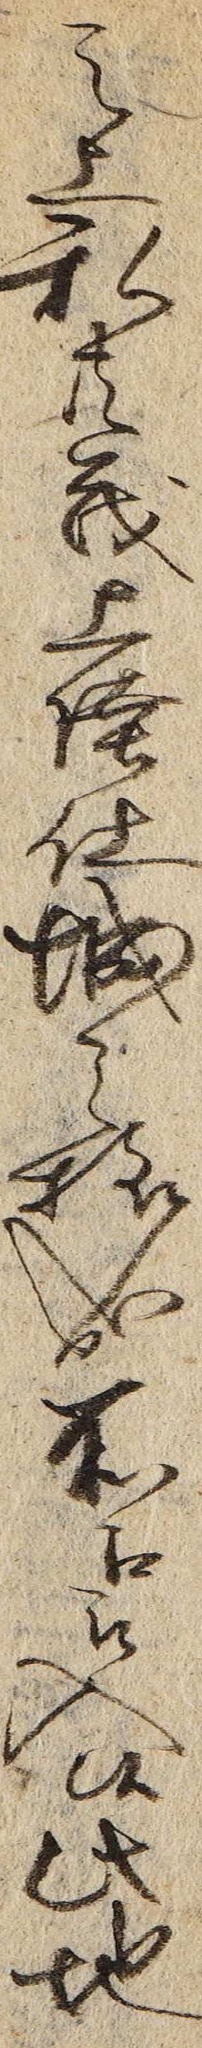の上私どもも上陸仕城の様なる所へ被入候此地
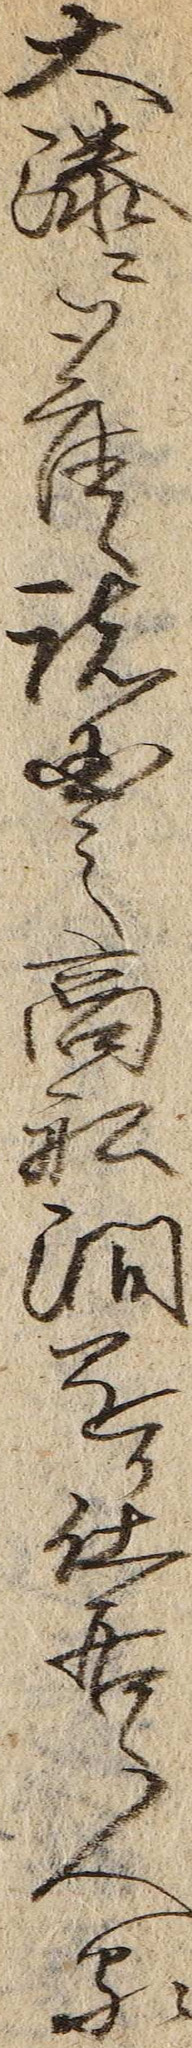大湊に御座候諸国の商船澗懸り仕居候うへ家
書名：能登国清兵衛異国江漂流之始末
